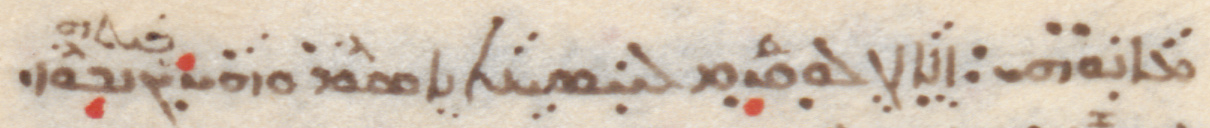ܡܐܢܘ̈ܗܝ: ܐܠܐ ܐܢ ܠܘܩܕܡ ܠܚܣܝܢܐ ܢܐܣܘܪ ܘܗܝܕܝܢ ܢܒܘܙ܆
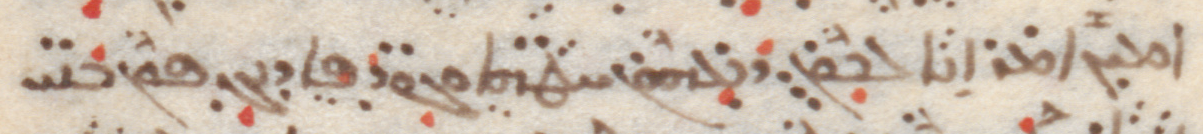ܐܡܝܢ ܐܡ̇ܪ ܐܢܐ ܠܟܘܢ܆ ܕܟܠܗܘܢ ܚܛܗ̈ܐ ܘܓܘ̈ܕܦܐ ܕܢܓܕܦܘܢ ܒܢ̈ܝ
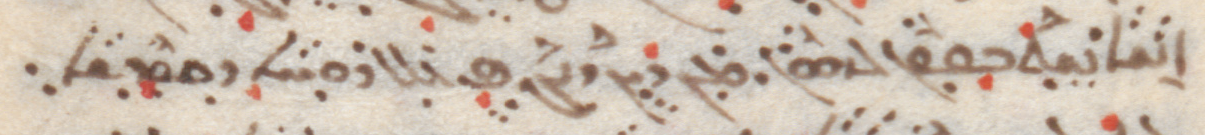ܐܢܫܐ ܢܫܬܒܩܘܢ ܠܗܘܢ܆ ܡܢ ܕܝܢ ܕܢܓܕܦ ܥܠ ܪܘܚܐ ܕܩܘܕܫܐ܆
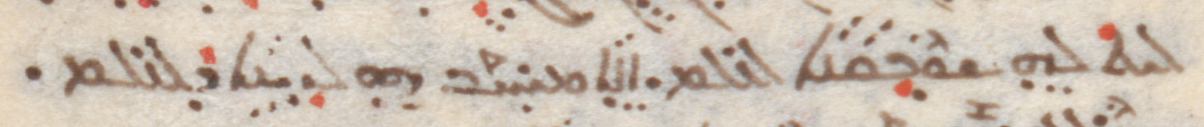ܠܝܬ ܠܗ ܫܘܒܩܢܐ ܠܥܠܡ. ܐܠܐ ܡܚܝܒ ܗ̣ܘ ܠܕܝܢܐ ܕܠܥܠܡ.
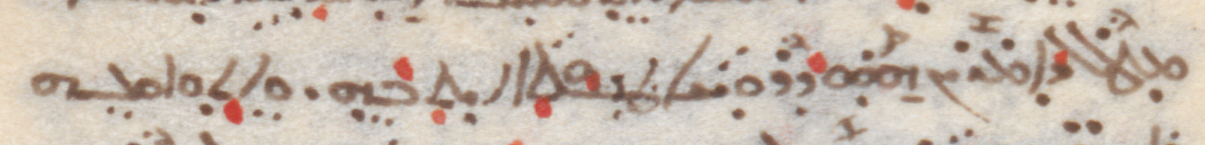ܡܛܠ ܕܐܡ̇ܪܝܢ ܗܘܘ ܕܪܘܚܐ ܛܢܦܬܐ ܐܝܬ ܒܗ. ܘܐܬܘ ܐܡܗ
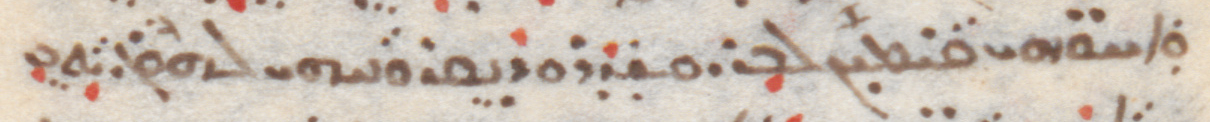ܘܐܚܘ̈ܗܝ ܩܝܡܝܢ ܠܒܪ. ܘܫܕܪܘ ܕܢܩܪܘܢܝܗܝ ܠܗܘܢ܆ ܝܬܒ
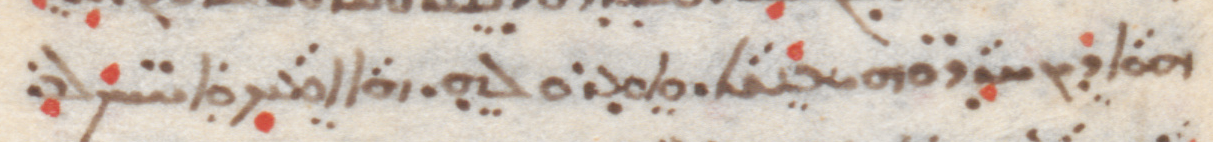ܗܘܐ ܕܝܢ ܚܕܪ̈ܘܗܝ ܟܢ̈ܫܐ. ܘܐܡ̣ܪܘ ܠܗ. ܗܐ ܐܡܟ ܘܐܚ̈ܝܟ ܠܒܪ
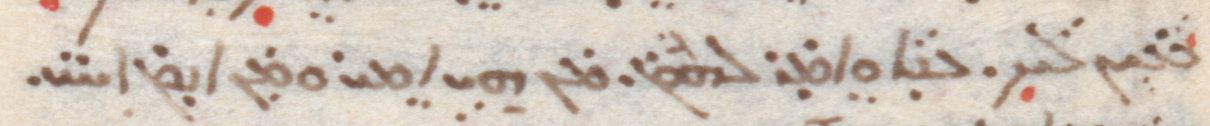ܒ̇ܥܝܢ ܠܝܟ. ܥܢ̣ܐ ܘܐܡܪ ܠܗܘܢ܆ ܡ̇ܢ ܗܝ ܐܡܝ ܘܡ̇ܢ ܐܢܘܢ ܐܚ̈ܝ.
